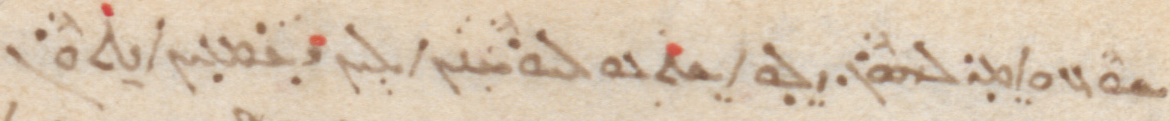ܝܫܘܥ ܘܐܡ̣ܪ ܠܗܘܢ. ܙܠ̣ܘ ܐܫܬܥܘ ܠܝܘܚܢܢ ܐܝܠܝܢ ܕܫܡܥܝܢ ܐܢܬܘܢ
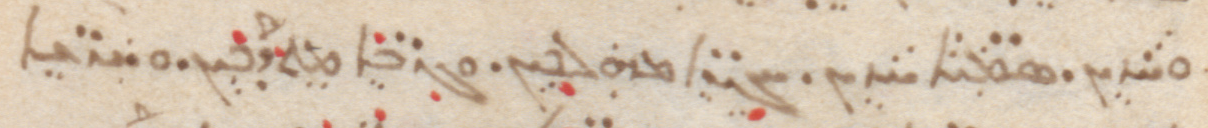ܘܚܙܝܢ. ܣܡ̈ܝܐ ܚܙܝܢ. ܚܓܝܪ̈ܐ ܡܗܠܟܝܢ. ܘܓܪ̈ܒܐ ܡܬܕܟܝܢ. ܘܚܪ̈ܫܐ
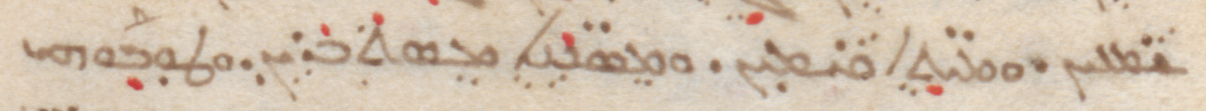ܫ̇ܡܥܝܢ. ܘܡ̈ܝܬܐ ܩܝܡܝܢ. ܘܡܣ̈ܟܢܐ ܡܣܬܒܪܝܢ܆ ܘܛܘܒܘܗܝ
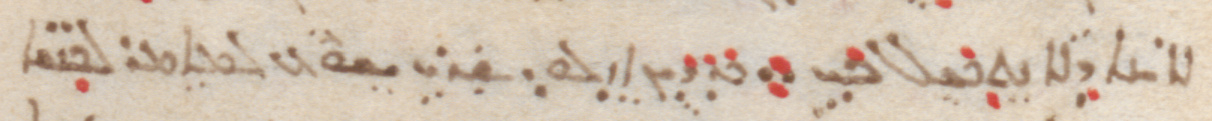ܠܐܝܢܐ ܕܠܐ ܢܬܟܫܠ ܒܝ ܀ ܟܕ ܕܝܢ ܐܙ̣ܠܘ܆ ܫܪܝ ܝܫܘܥ ܠܡܐܡܪ ܠܟܢܫ̈ܐ
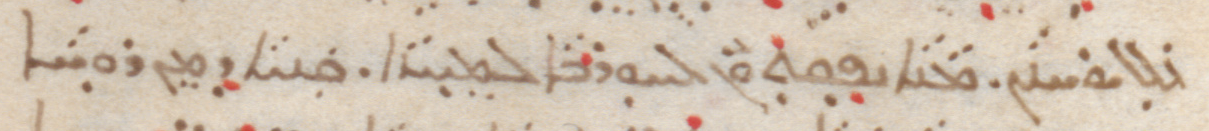ܥܠ ܝܘܚܢܢ. ܡܢܐ ܢܦܩܬܘܢ ܠܚܘܪܒܐ ܠܡܚܙܐ. ܩܢܝܐ ܕܡ̣ܢ ܪܘܚܐ
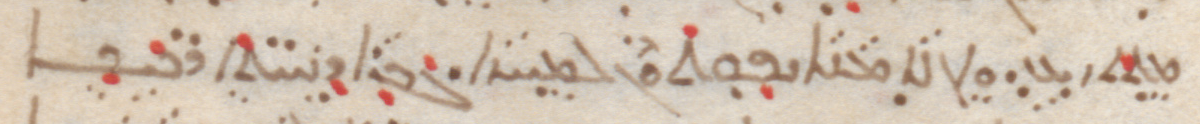ܡܬܬܙܥ: ܘܐܢ ܠܐ ܡܢܐ ܢܦܩܬܘܢ ܠܡܚܙܐ. ܓܒܪܐ ܕܢܚ̈ܬܐ ܪ̈ܟܝܟܐ
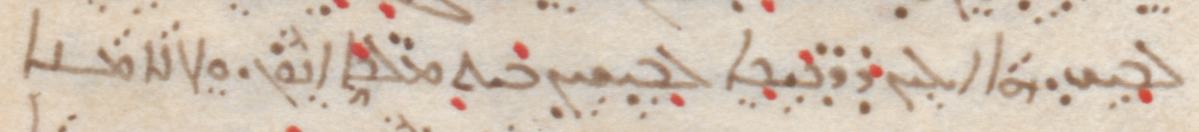ܠܒܝܫ܆ ܗܐ ܐܠܝܢ ܕܪ̈ܟܝܟܐ ܠܒܝ̣ܫܝܢ ܒܝܬ ܡ̈ܠܟܐ ܐܢܘܢ. ܘܐܢ ܠܐ ܡܢܐ
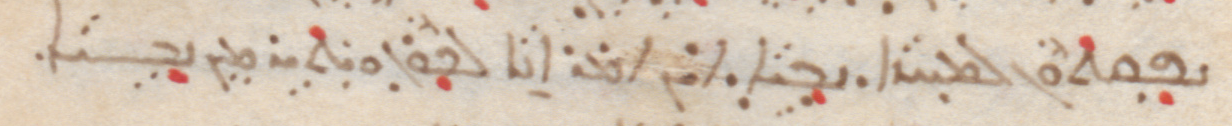ܢܦ̣ܩܬܘܢ ܠܡܚܙܐ. ܢܒܝܐ܆ ܐܝܢ ܐܡ̇ܪ ܐܢܐ ܠܟܘܢ ܘܝܬܝܪ ܡܢ ܢܒܝܐ.
